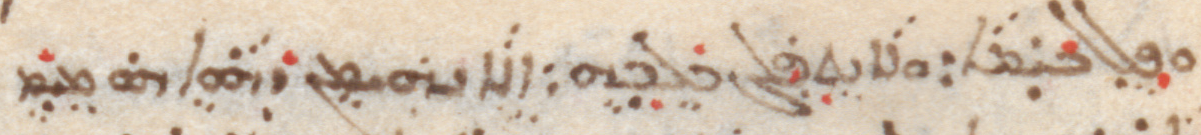ܘܦܠ ܒܝܡܐ: ܘܠܐ ܢܬܦܠܓ ܒܠܒܗ: ܐܠܐ ܢܗܝܡܢ ܕܗܘ̇ܐ ܗ̇ܘ ܡܕܡ
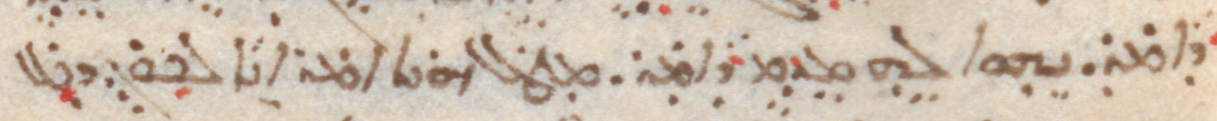ܕܐܡ̇ܪ܆ ܢܗܘܐ ܠܗ ܡܕܡ ܕܐܡ̣ܪ. ܡܛܠ ܗܢܐ ܐܡ̇ܪ ܐܢܐ ܠܟܘܢ܆ ܕܟܠ
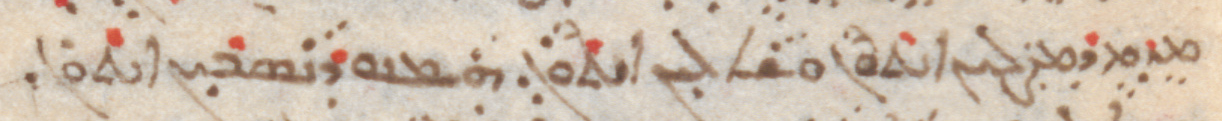ܡܕܡ ܕܡܨܠܝܢ ܐܢܬܘܢ ܘܫ̇ܐܠܝܢ ܐܢܬܘܢ܆ ܗܝܡܢܘ ܕܢܣܒܝܢ ܐܢܬܘܢ.
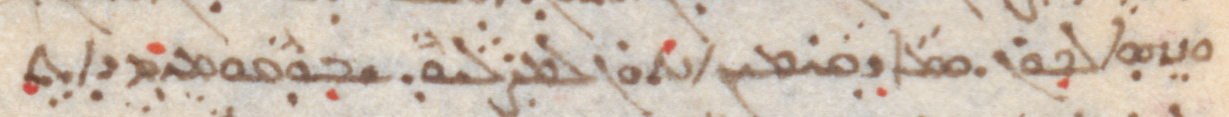ܘܢܗܘܐ ܠܟܘܢ. ܘܡܐ ܕܩܝܡܝܢ ܐܢܬܘܢ ܠܡܨܠܝܘ܆ ܫܒܘܩܘ ܡܕܡ ܕܐܝܬ
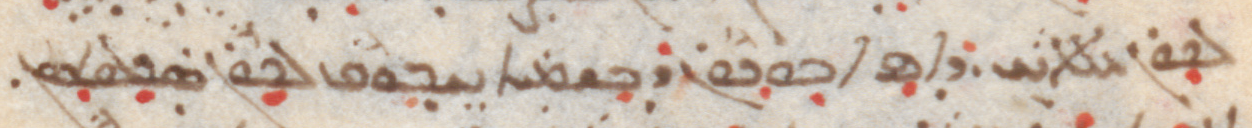ܠܟܘܢ ܥܠ ܐܢܫ. ܕܐܦ ܐܒܘܟܘܢ ܕܒܫܡܝܐ ܢܫܒܘܩ ܠܟܘܢ ܣܟܠܘܬܟܘܢ
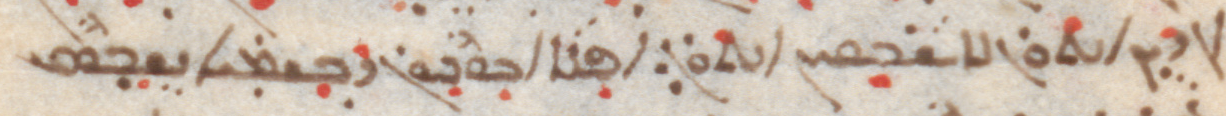ܐܢ ܕܝܢ ܐܢܬܘܢ ܠܐ ܫ̇ܒܩܝܢ ܐܢܬܘܢ܆ ܐܦܠܐ ܐܒܘܟܘܢ ܕܒܫܡܝܐ ܢܫܒܘܩ
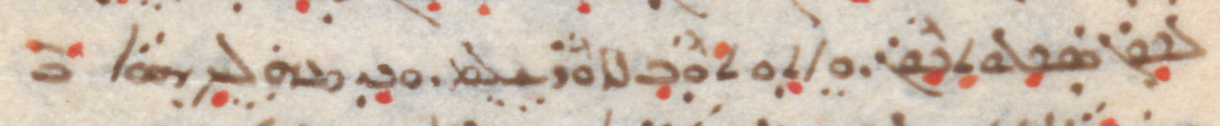ܠܟܘܢ ܣܟܠܘܬܟܘܢ. ܘܐܬ̣ܘ ܬܘܒ ܠܐܘܪܫܠܡ. ܘܟܕ ܡܗܠܟ ܗܘܐ ܏ܒ
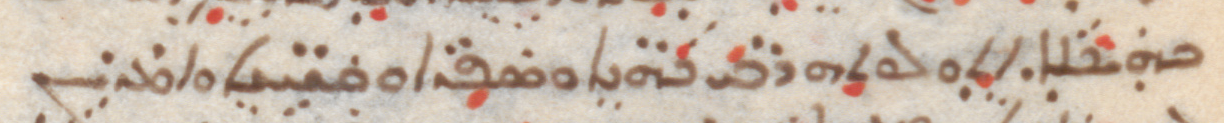ܒܗܝܟܠܐ. ܐܬ̣ܘ ܠܘܬܗ ܪ̈ܒܝ ܟܗ̈ܢܐ ܘܣܦܪ̈ܐ ܘܩܫ̈ܝܫܐ ܘܐܡ̇ܪܝܢ
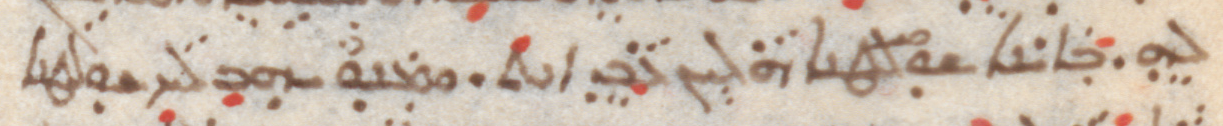ܠܗ. ܒܐܝܢܐ ܫܘܠܛܢܐ ܗܠܝܢ ܥ̇ܒܕ ܐܢܬ. ܘܡܢܘ ܝܗ̣ܒ ܠܟ ܫܘܠܛܢܐ
